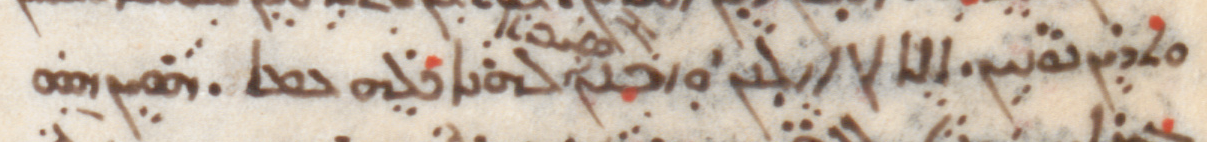ܘܬܪ̈ܝܢ ܢܘܢ̈ܝܢ. ܐܠܐ ܐܢ ܐܙܠܢܢ ܘܙܒܢܢ ܣܝܒܪܬܐ ܠܗܢܐ ܟܠܗ ܥܡܐ. ܗܘܝܢ ܗܘܘ
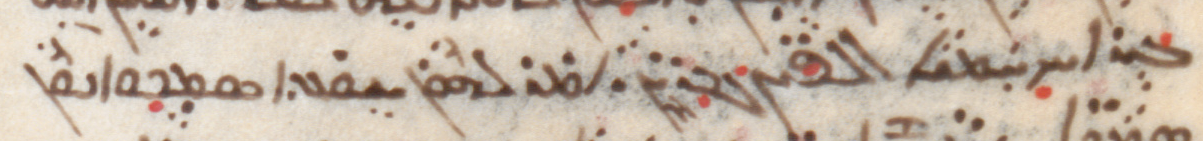ܓܝܪ ܐܝܟ ܚܡܫܐ ܐܠܦܝ̈ܢ ܓܒܪ̈ܝܢ: ܐܡ̇ܪ ܠܗܘܢ ܝܫܘܥ. ܐܣܡ̣ܟܘ ܐܢܘܢ
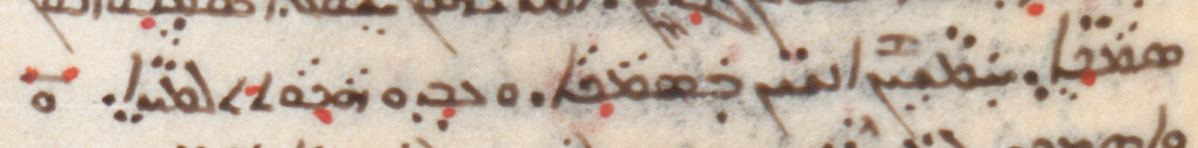ܣ̈ܡܟܐ܆ ܚܡܫܝܢ ܐܢܫܝ̈ܢ ܒܣܡܟܐ. ܘܥܒ̣ܕܘ ܗܟܘܬ ܬܠܡܝ̈ܕܐ܆ ܏ܘ
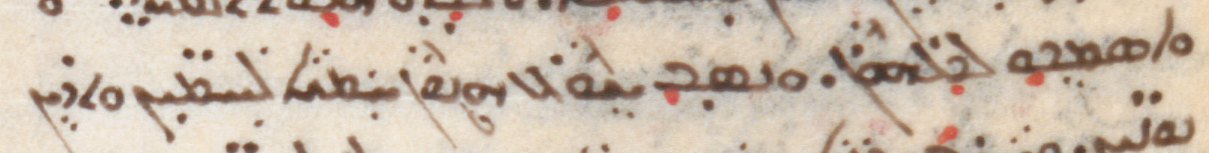ܘܐܣܡܟܘ ܠܟܠܗܘܢ. ܘܢܣ̣ܒ ܝܫܘܥ ܗܢܘܢ ܚܡܫܐ ܠܚ̈ܡܝܢ ܘܬܪ̈ܝܢ
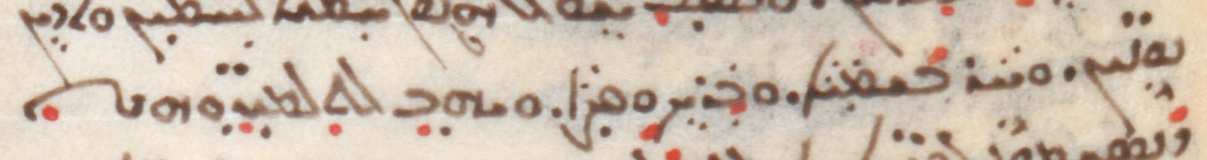ܢܘܢ̈ܝܢ. ܘܚܪ ܒܫܡܝܐ. ܘܒ̣ܪܟ ܘܩ̣ܨܐ. ܘܝܗ̣ܒ ܠܬܠܡܝ̈ܕܘܗܝ
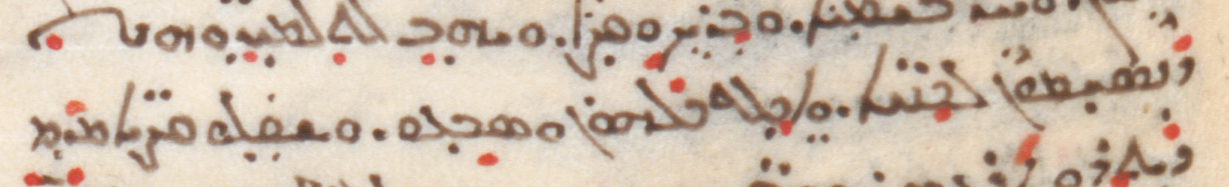ܕܢܣܝܡܘܢ ܠܟܢ̈ܫܐ. ܘܐܟ̣ܠܘ ܟܠܗܘܢ ܘܣܒ̣ܥܘ. ܘܫܩ̣ܠܘ ܩܨܝ̈ܐ ܡܕܡ
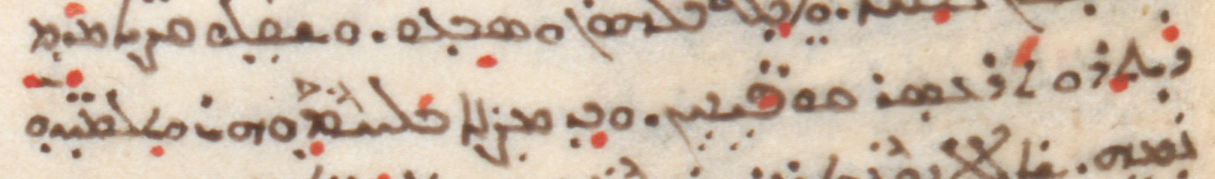ܕܝܬܪܘ ܬܪܥܣܪ ܩܘܦܝ̈ܢܝܢ. ܘܟܕ ܡܨܠܐ ܒܠܚܘܕܘܗܝ ܘܬܠܡܝ̈ܕ܏ܘ
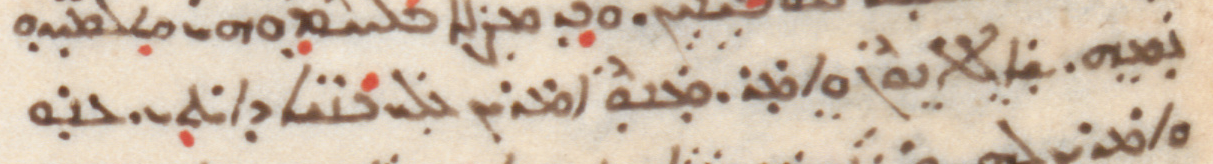ܥܡܘ. ܫܐܠ ܐܢܘܢ ܘܐܡ̣ܪ. ܡܢܘ ܐܡ̇ܪܝܢ ܥܠܝ ܟܢ̈ܫܐ ܕܐܝܬܝ ܥܢܘ
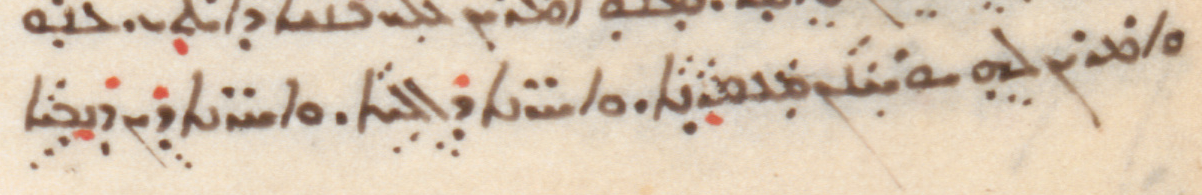ܘܐܡ̇ܪܝܢ ܠܗ ܕܝܘܚܢܢ ܡܥܡܕܢܐ. ܘܐܚܪ̈ܢܐ ܕܐܠܝܐ. ܘܐܚܪ̈ܢܐ ܕܝܢ ܕܢܒܝܐ
